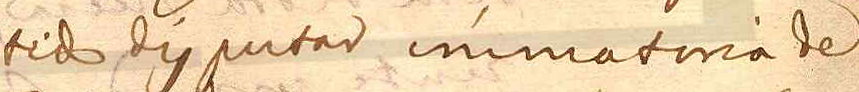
tido disputar em materia de
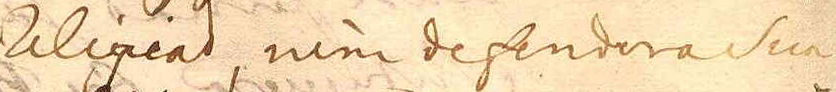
Religiaõ, nem defender a sua
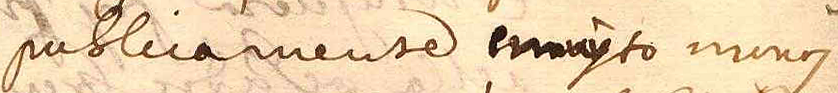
publicamente, e muyto menos
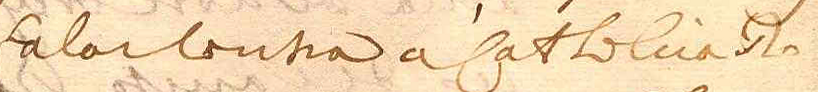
falar contra a Catholica Ro
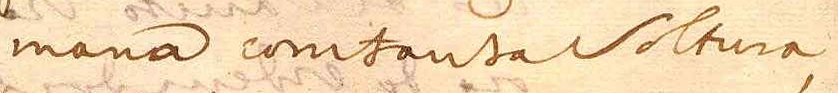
mana com tanta soltura,
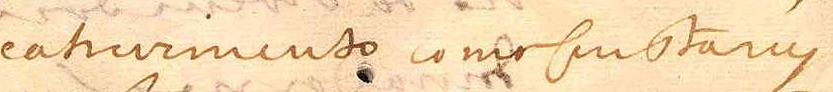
e atrevimento como Consta nes
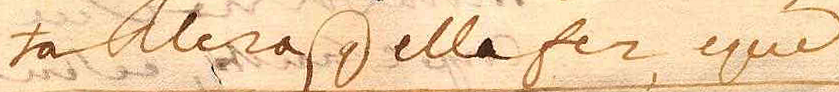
ta Meza q̄ ella fez, e que
